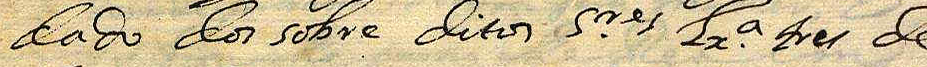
dado dos sobreditos s.res Lx.a tres de
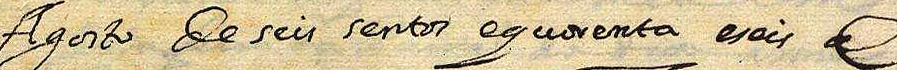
Agosto de seissentos e quorenta e seis ā
